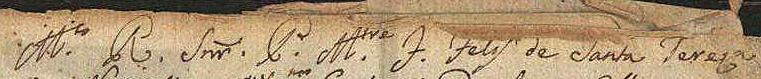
M.to R. Snr̄. P. M.tre F. Felis de Santa Tereza
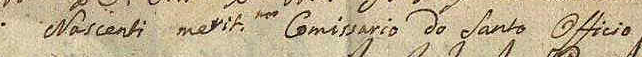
Nascenti merit.mo Comissario do Santo Officio
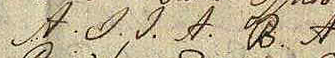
A.I.I. A. B. A.
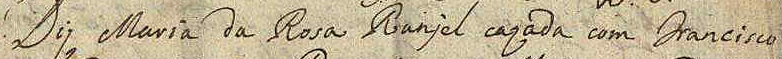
Diz Maria da Rosa Ranjel cazada com Francisco
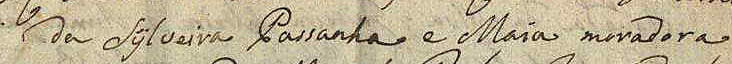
da Sylveira Passanha e Maia moradora
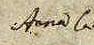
Anna ca
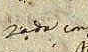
zada com
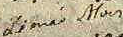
Simaõ Alves
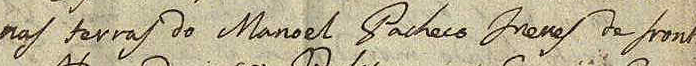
nas terras do Manoel Pacheco Freues defronte
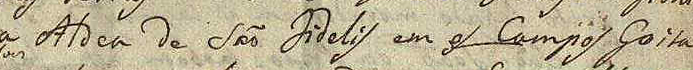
a Aldea de Saõ Fidelis em os Campos Goita
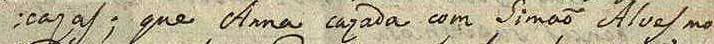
cazas; que Anna cazada com Simaõ Alves mo
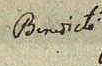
Benedicto
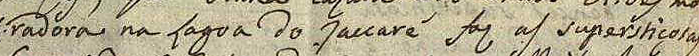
radora na Lagoa do Jaccaré faz as superstiçosas
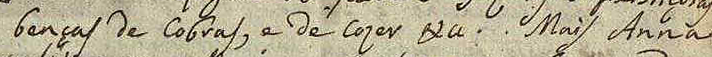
benças de cobras, e de cozer &c. Mais Anna
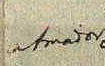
Amador
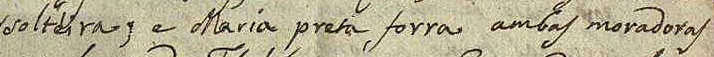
solteira, e Maria preta forra, ambas moradoras
